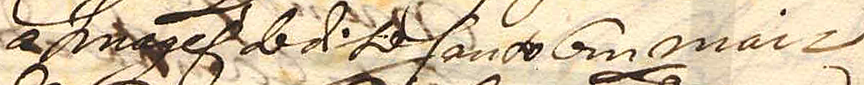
a Jmagē do dito Santo com maiz
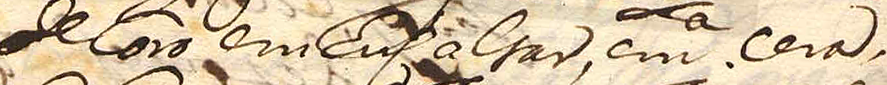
de Coro em hū altar, e m.ta cera
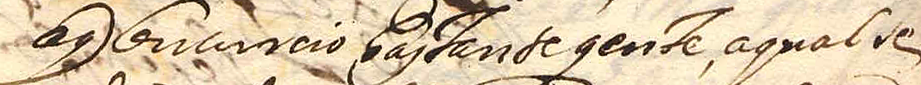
o q̄ Concorreio bastante gente, a qual se
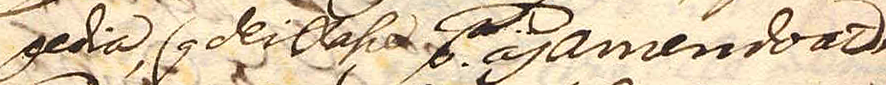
pedia, q̄ deixasse p.a as amendoaz,
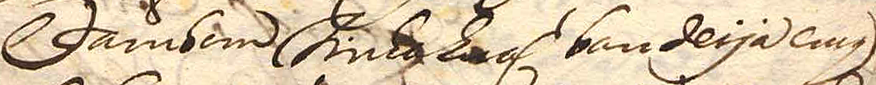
e tambem tinha huā bandeija com q̄
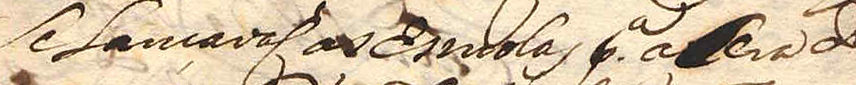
Se Lançavaõ as Esmolas p.a a Cera do
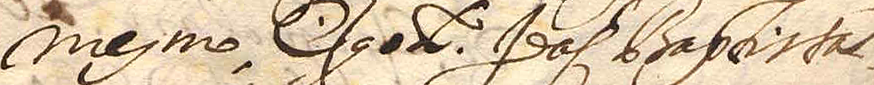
mesmo, E q̄ o d.o Joaõ Baptista
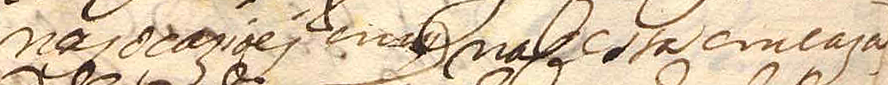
nas ocazioēs em q̄ naõ esta em caza
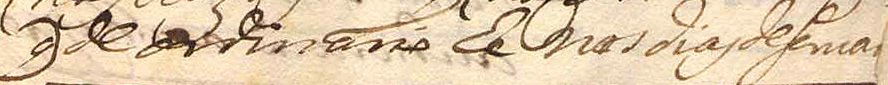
q̄ de ordinario he nos dias de sema
